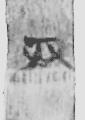四
